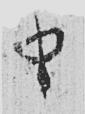中（仲）
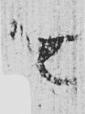尼
